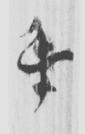身
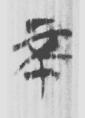不
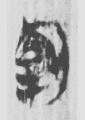解
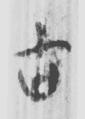古
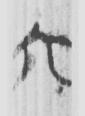六
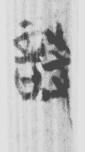詩
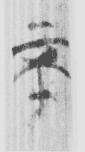不
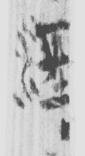涇
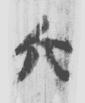六
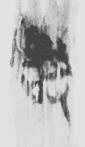詩
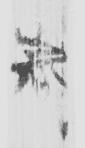者
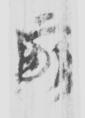所
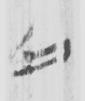㠯（以）
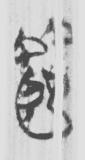節
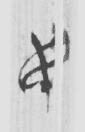民
